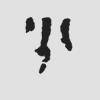少
